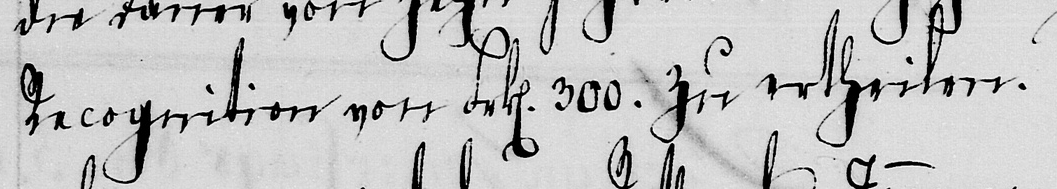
Recognition von Frk[en]. 300. zu ertheilen.
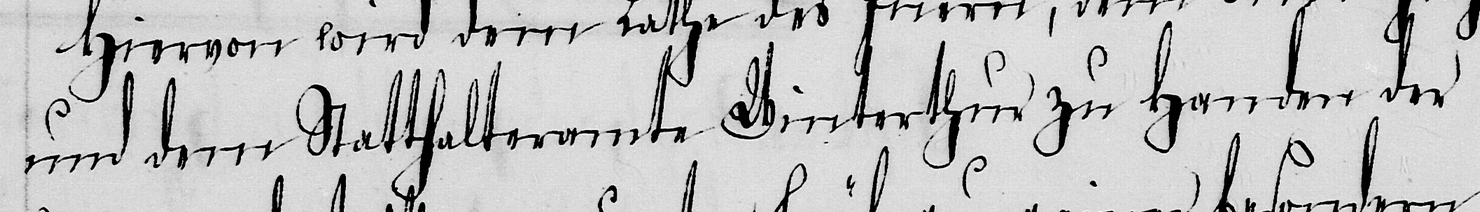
und dem Statthalteramte Winterthur zu Handen der
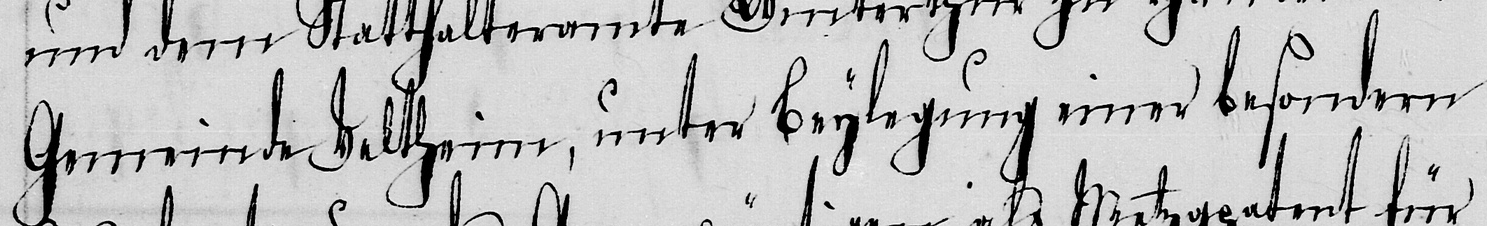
Gemeinde Veltheim, unter Beylegung einer besondern
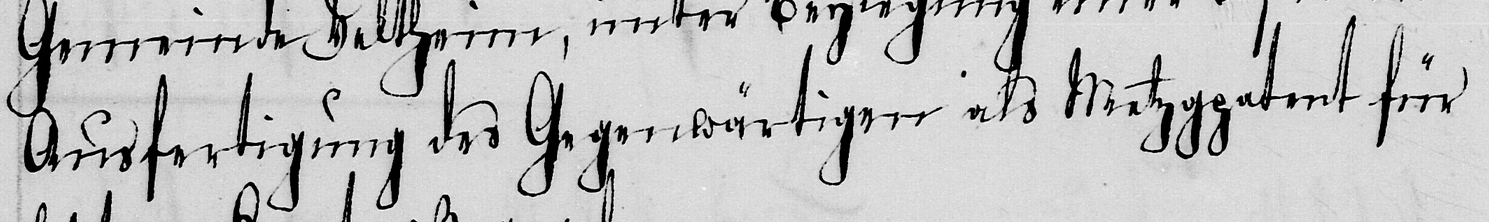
Ausfertigung des Gegenwärtigen als Metzgpatent für
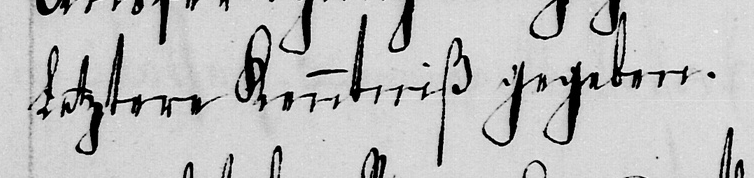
Letztere Kenntniß gegeben.
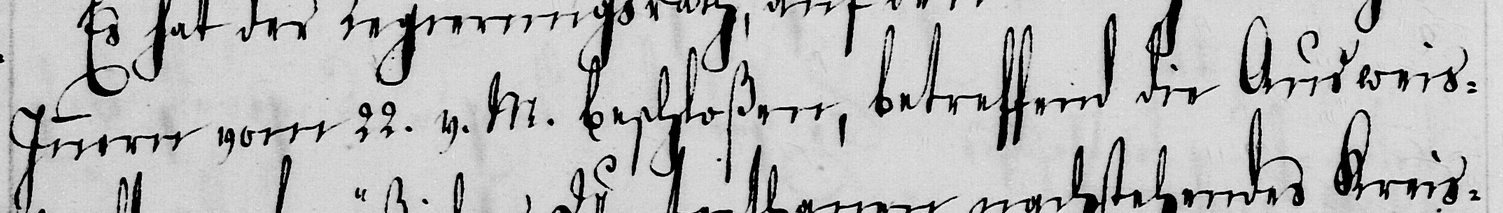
Innern vom 22. v. M. beschloßen, betreffend die Ausweiss¬
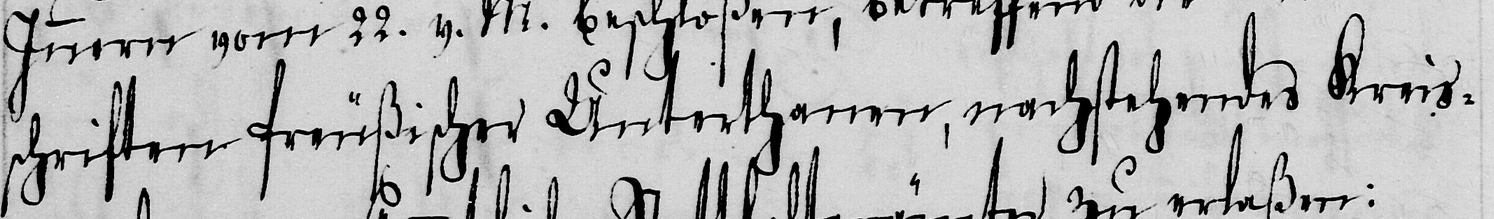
chriften Preußischer Unterthanen, nachstehendes Kreis¬
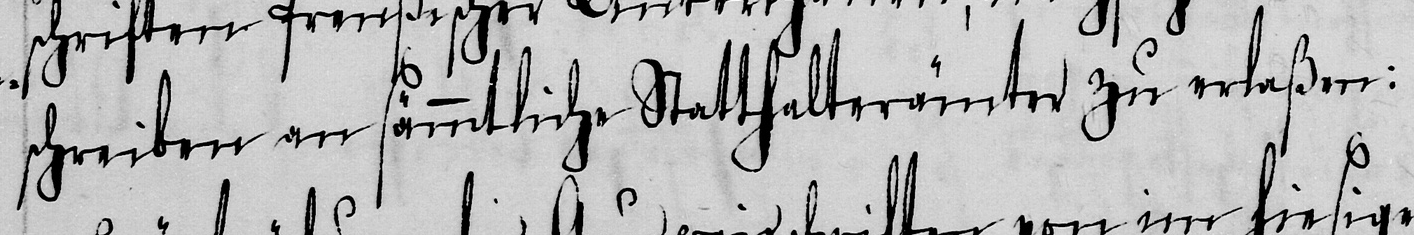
schreiben an sämmtliche Statthalterämter zu erlaßen:
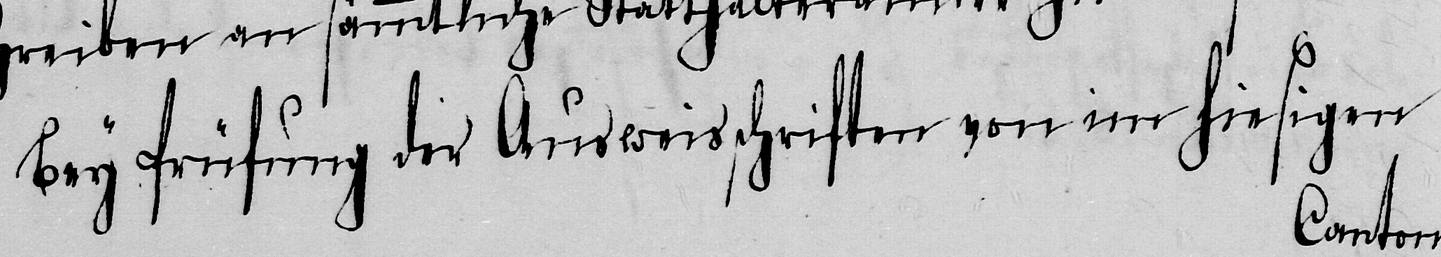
Bey Prüfung der Ausweisschriften von im hiesigen
